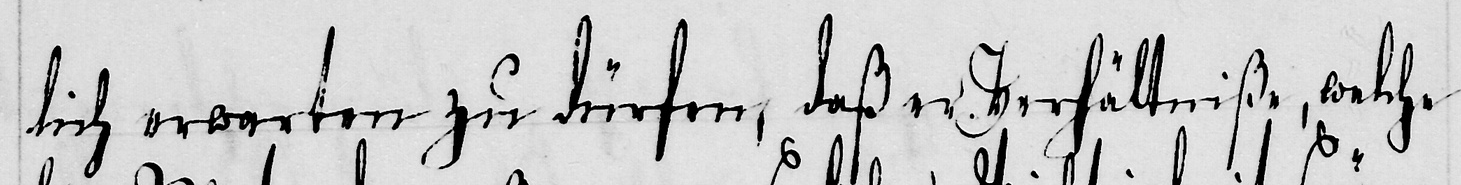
lich erwarten zu dürfen, daß er Verhältniße, welche
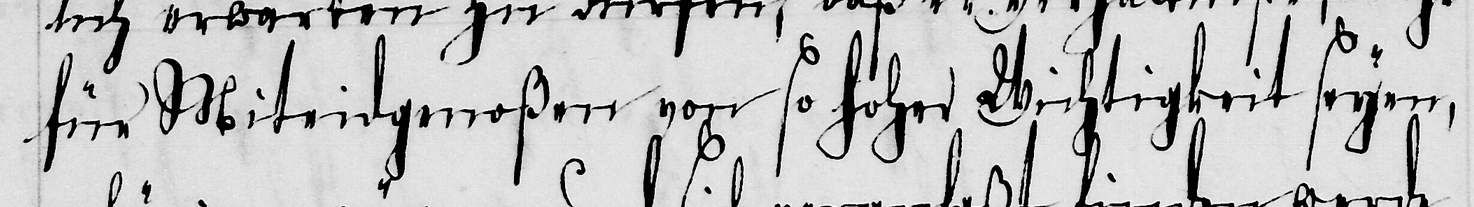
für Miteidgenoßen von so hoher Wichtigkeit seyen,
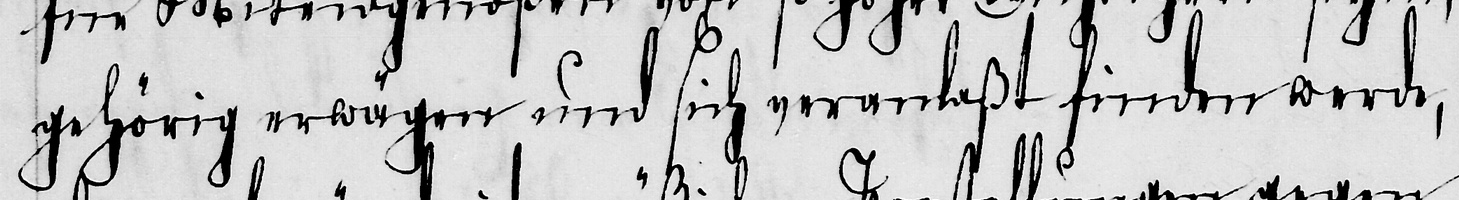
gehörig erwägen und sich veranlaßt finden werde,
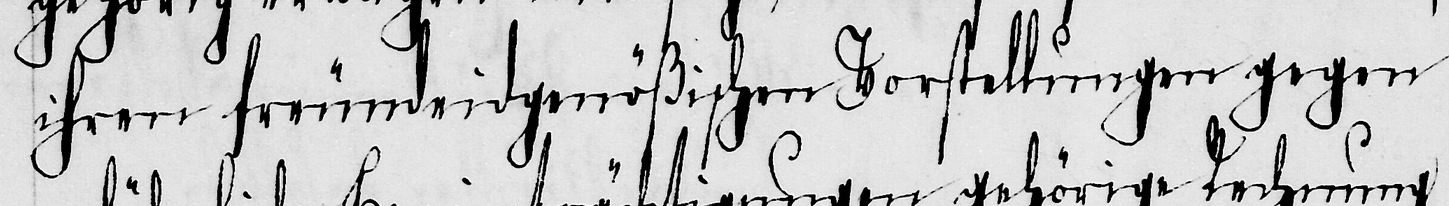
ihren freundeidgenößischen Vorstellungen gegen
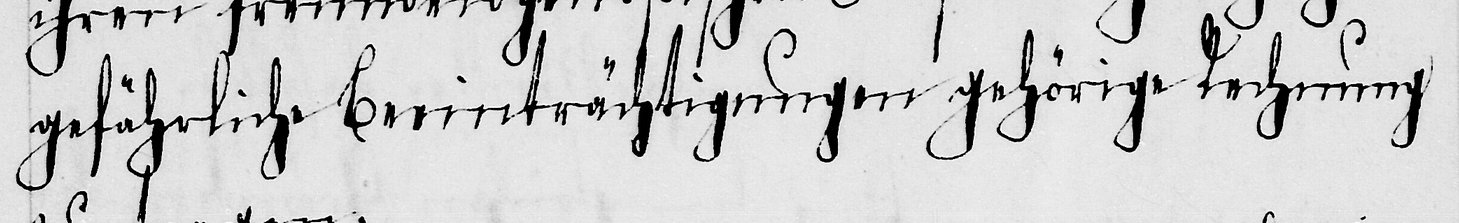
gefährliche Beeinträchtigungen gehörige Rechnung
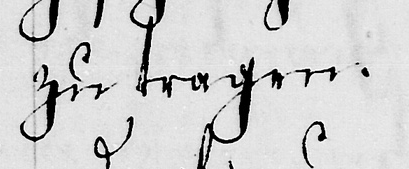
zu tragen.
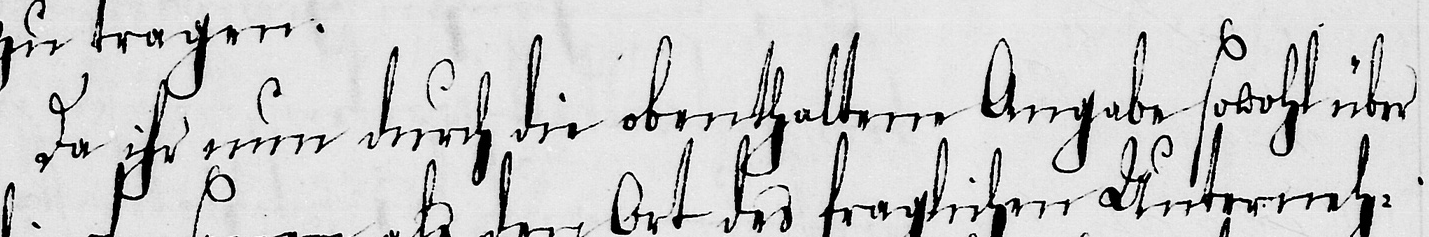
Da ihr nun durch die obenthaltene Angabe sowohl üb¬
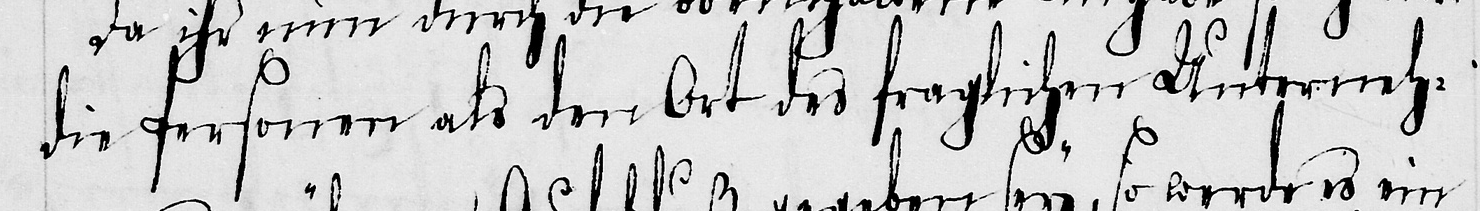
die Personen als den Ort des fraglichen Unterneh¬
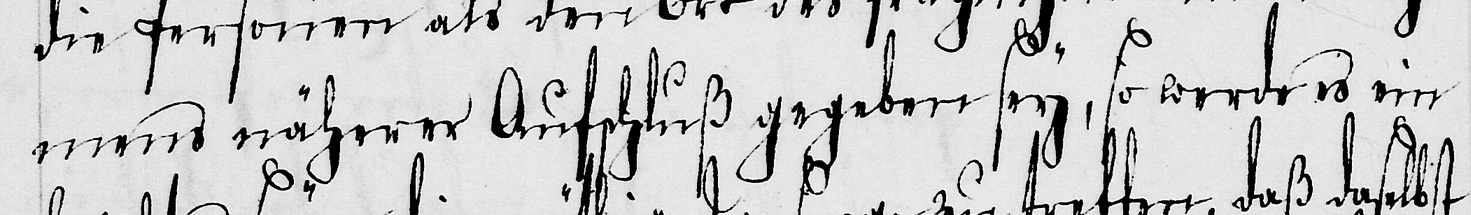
mens näherer Aufschluß gegeben sey, so werde es ein
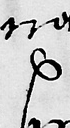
l¬
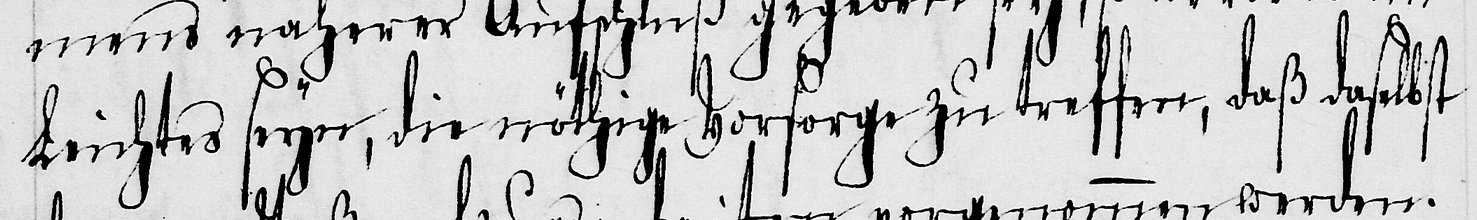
Leichtes seyn, die nöthige Vorsorge zu treffen, daß daselbst
